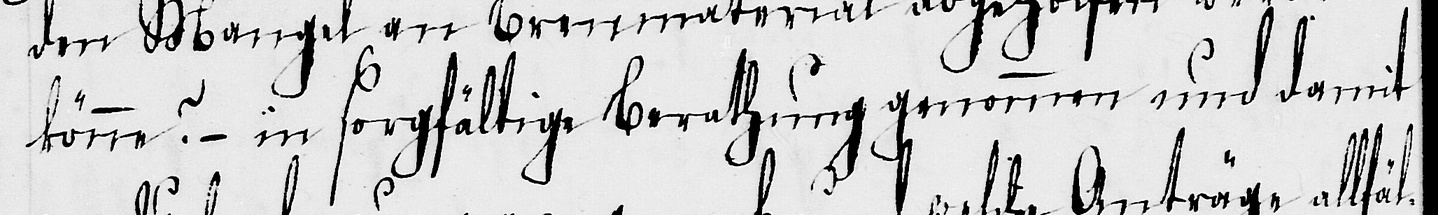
könne? – in sorgfältige Berathung genommen und damit
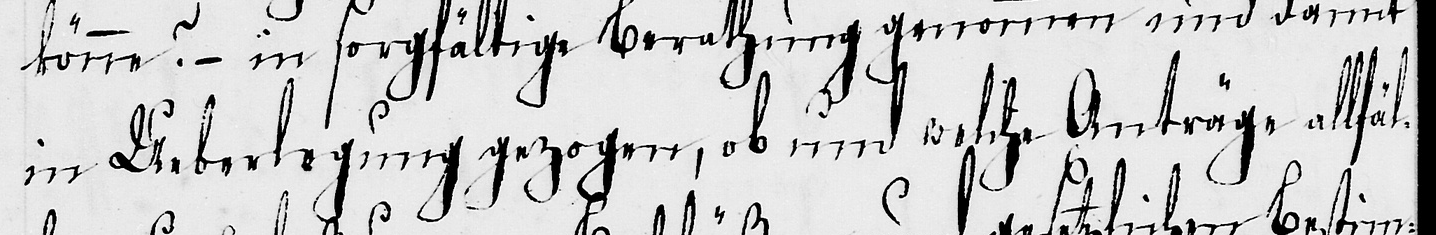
in Ueberlegung gezogen, ob und welche Anträge allfäl¬
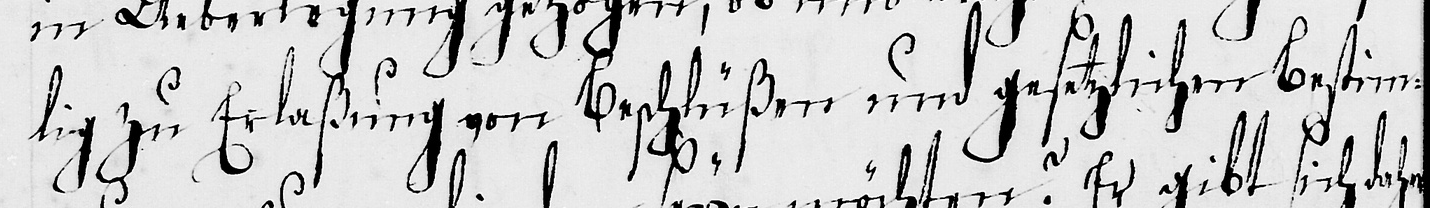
lig zu Erlaßung von Beschlüßen und gesetzlichen Bestim¬
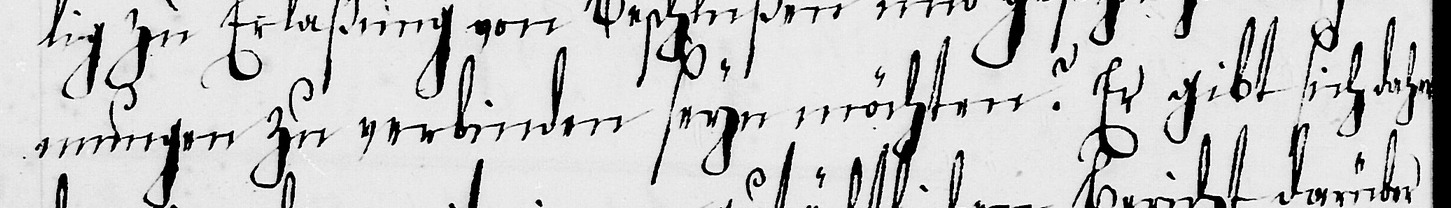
mungen zu verbinden seyn möchten? Er gibt sich daher
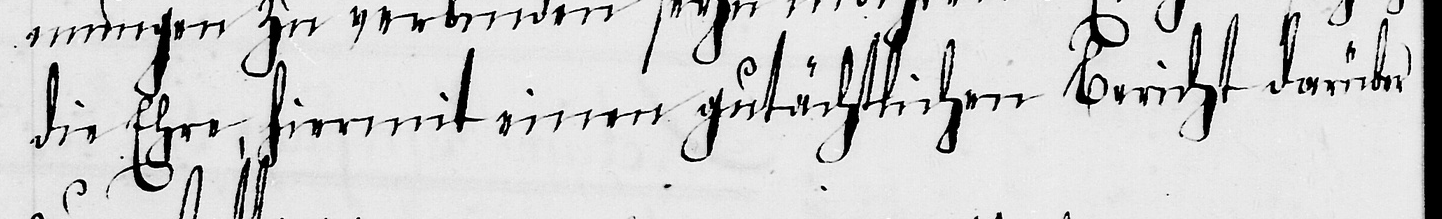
die Ehre, hiermit einen gutächtlichen Bericht darüber
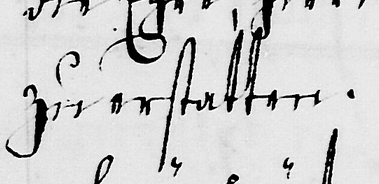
zu erstatten.
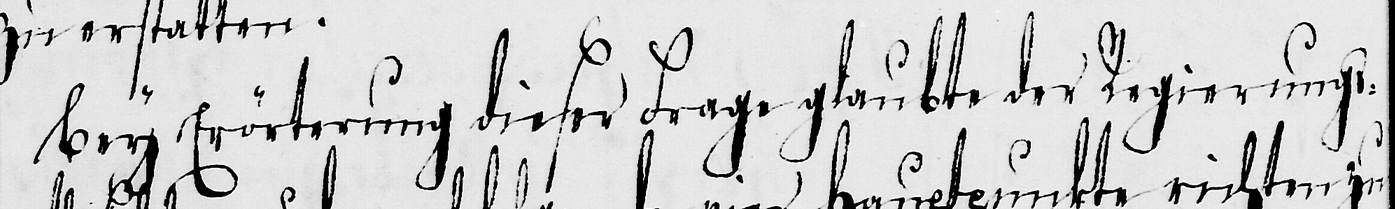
Bey Erörterung dieser Frage glaubte der Regierungs¬
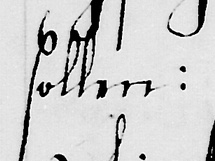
sollen:
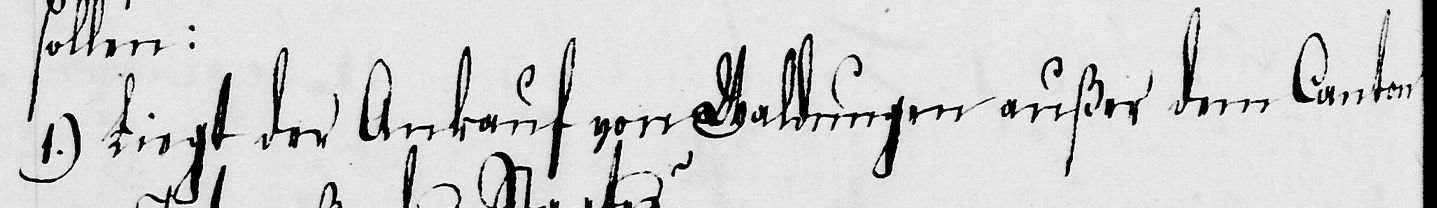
1.) Liegt der Ankauf von Waldungen außer dem Canton
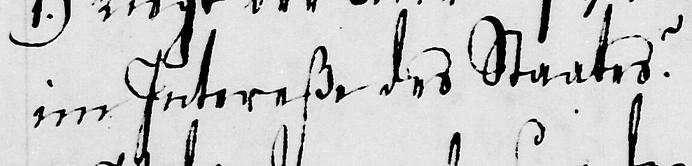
im Intereße des Staates?
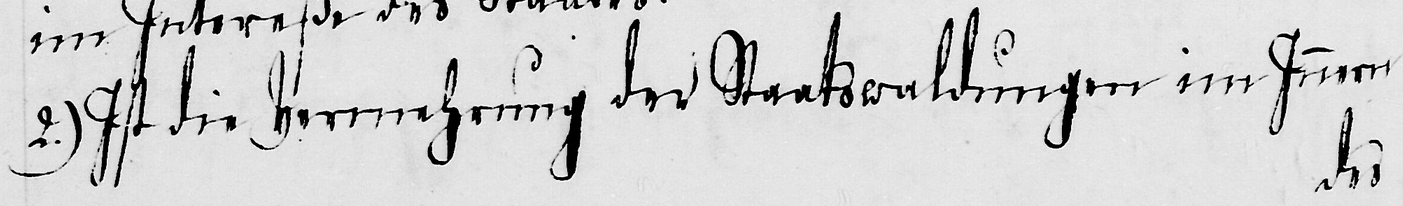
2.) Ist die Vermehrung der Staatswaldungen im Inne¬
